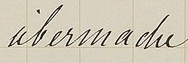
übermache
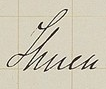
Ihnen
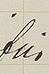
25.
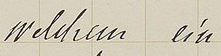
welchem ein
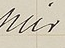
besteht.
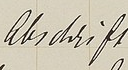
Abschrift
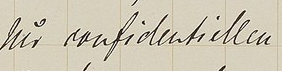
zur confidentiellen
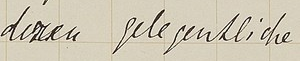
deren gelegentliche
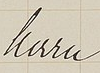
bitte.
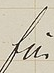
die
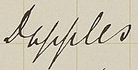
Dapples
